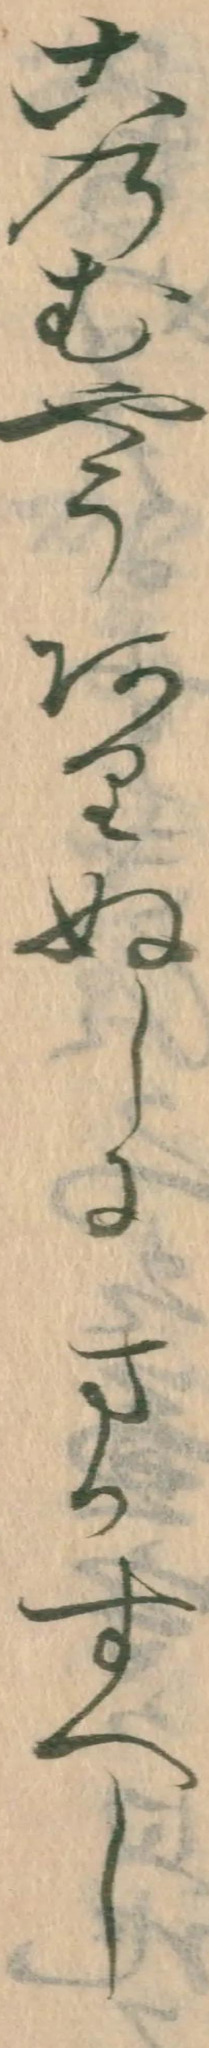このむやうありぬしにまかすへし
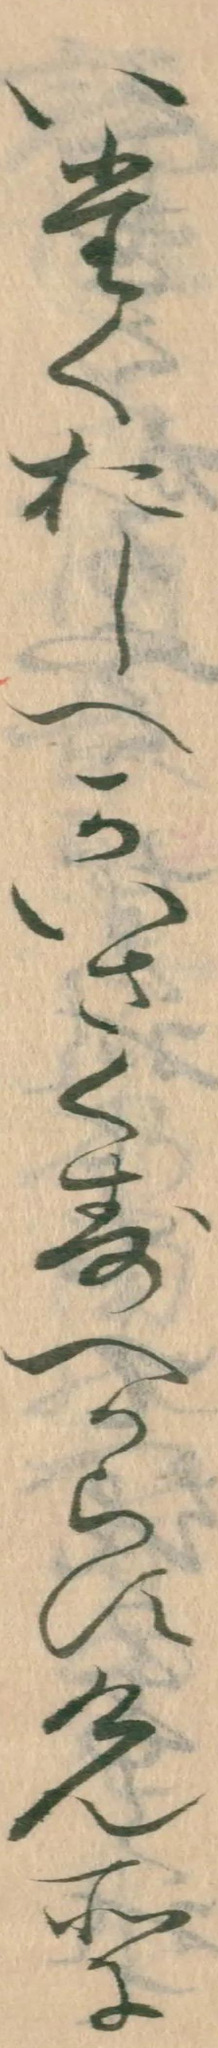一いたくおしへかいさくすへからすけん所に
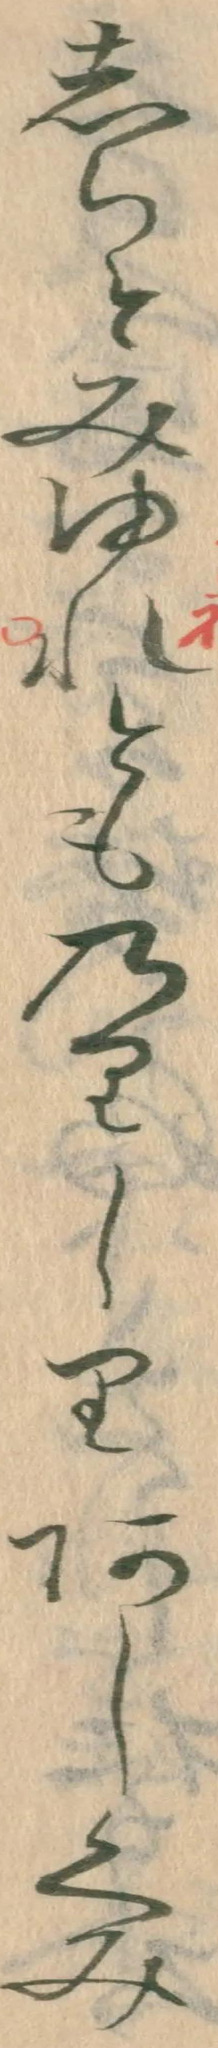しらとみゆれとものりしりあしくみ
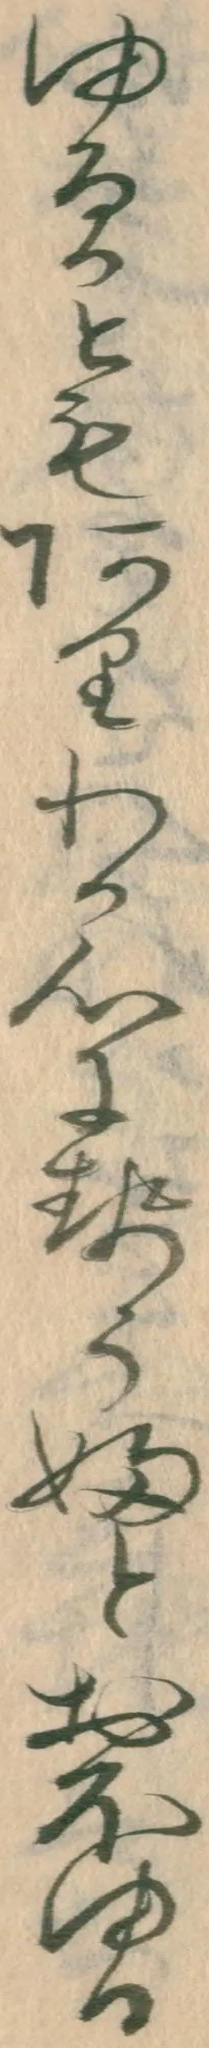ゆるかともありわか心にせうふとおほゆる
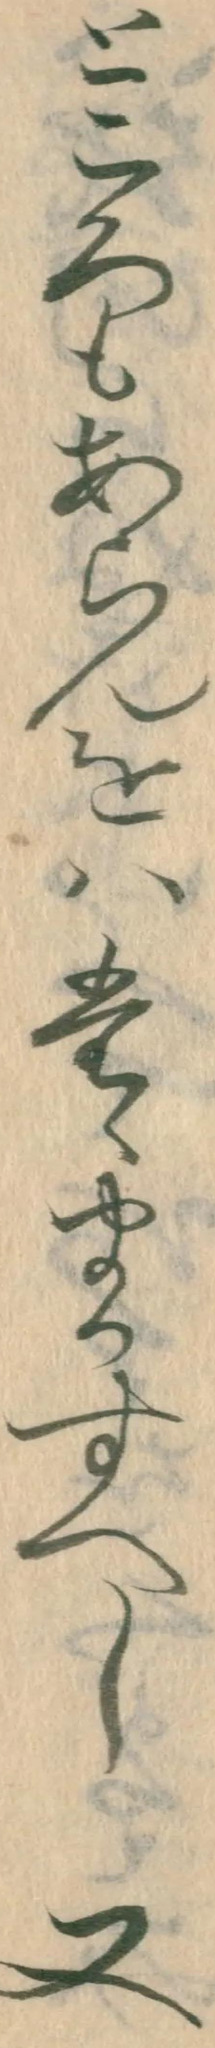ところもあらんをはたゝまかすへし又
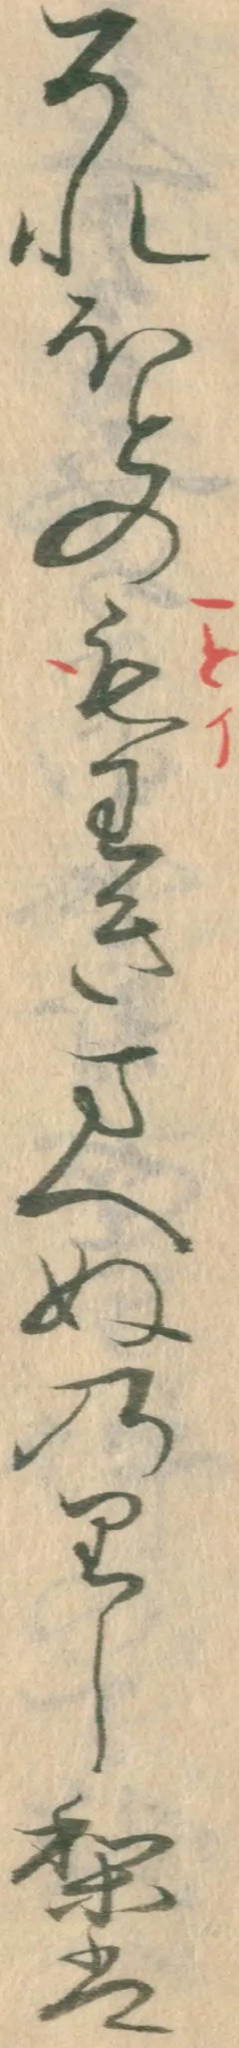それほとのもわきまへぬのりしりは
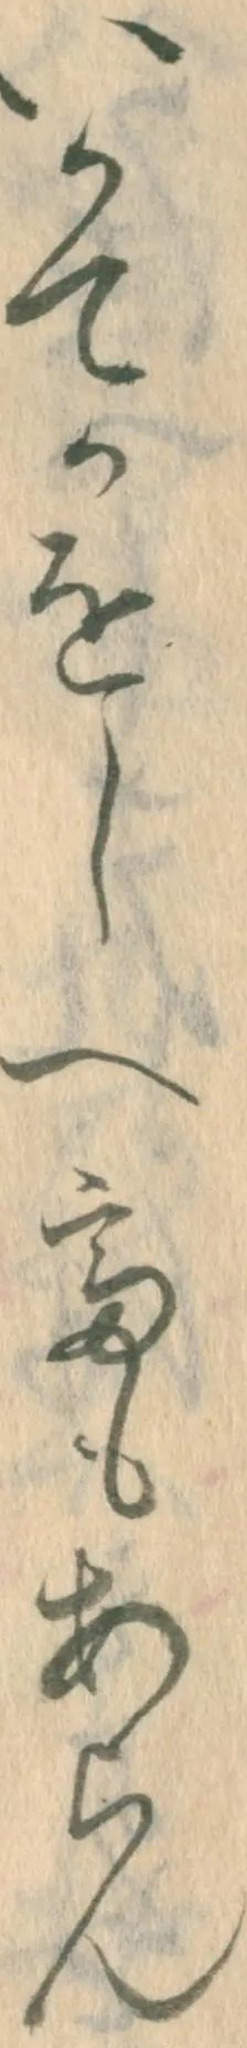いかてかをしへてもあらん
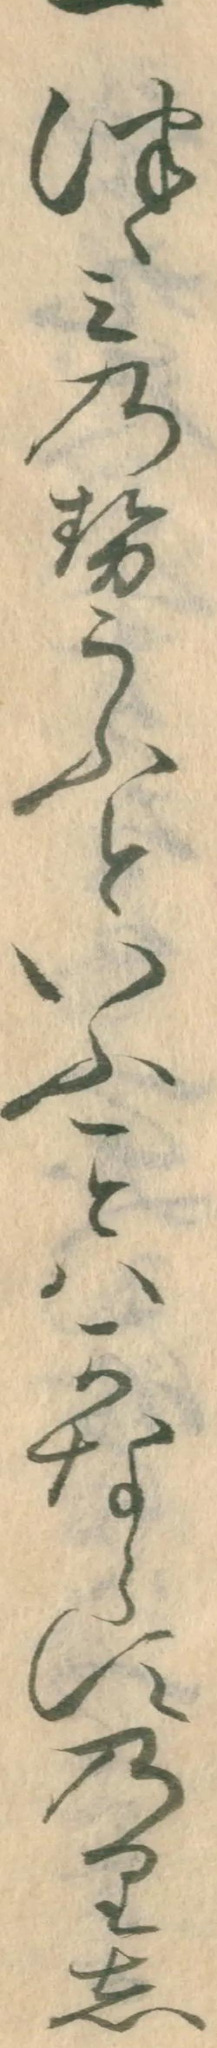一つゝみのせうふといふことはかならすのりし
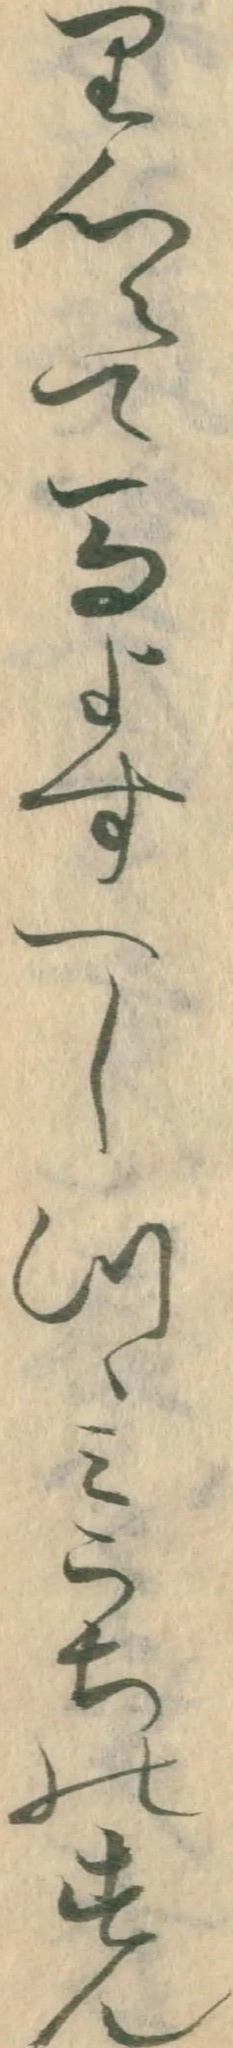り心えて馬よすへしつゝみうちのすん

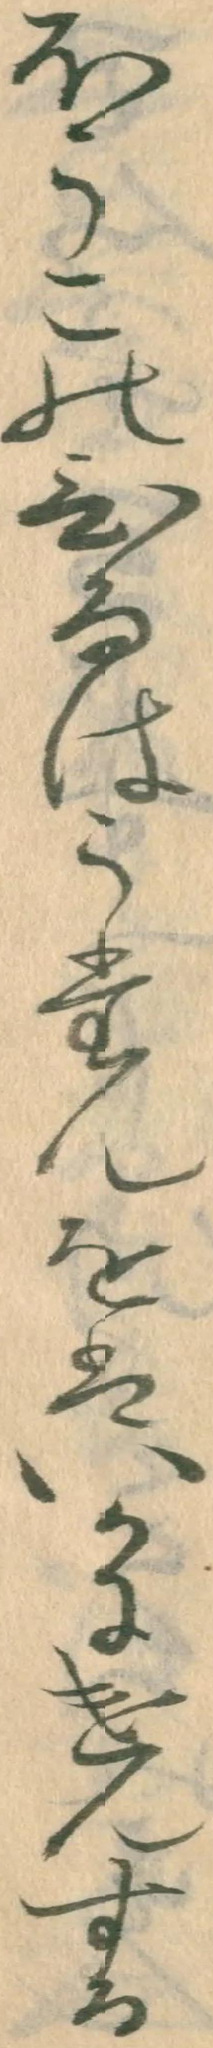ほうこのひるはうたんをはいかにけんする
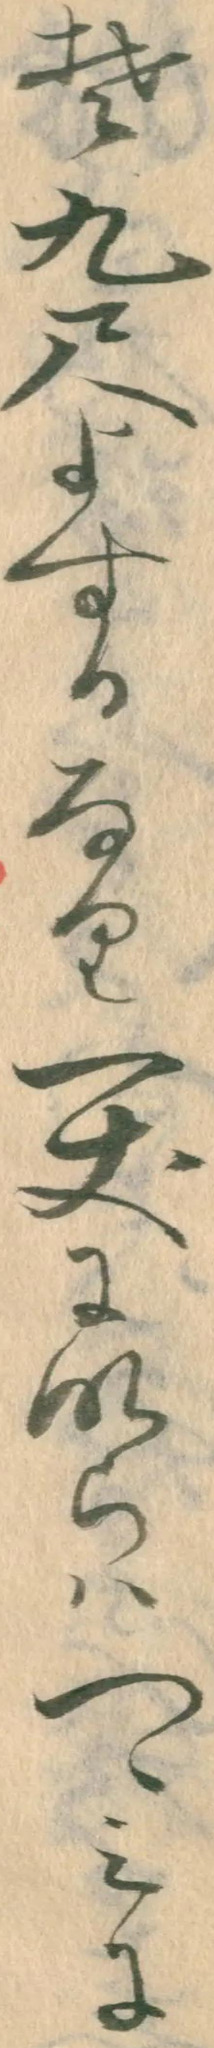そ九尺よするなり一丈にならはつゝみに
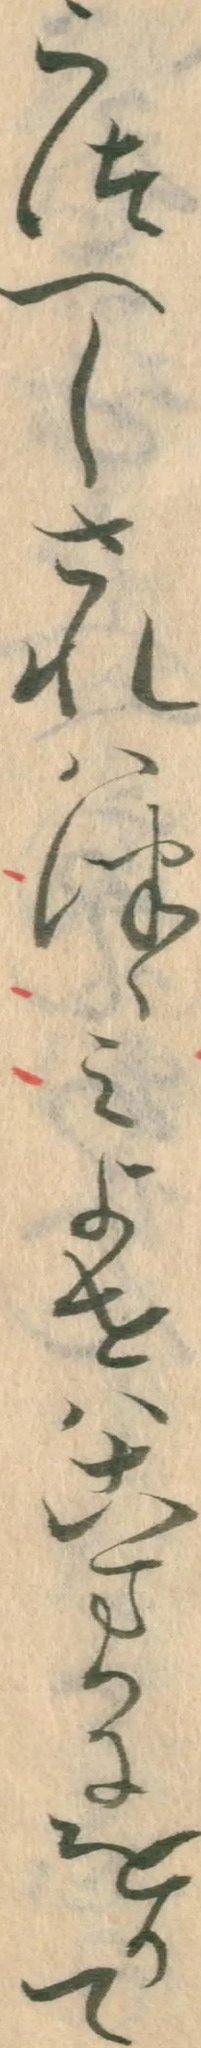うつへしされは「つゝみ」よせはこまかにをりて
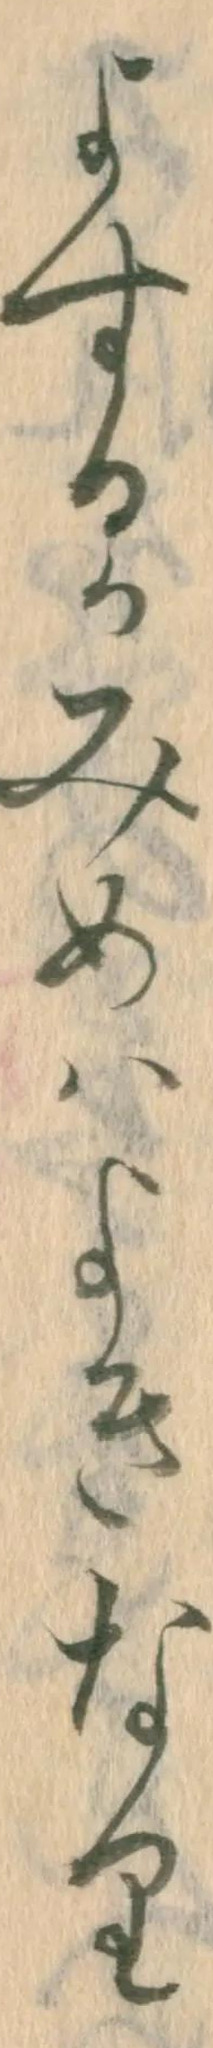よするかみめはよきなり
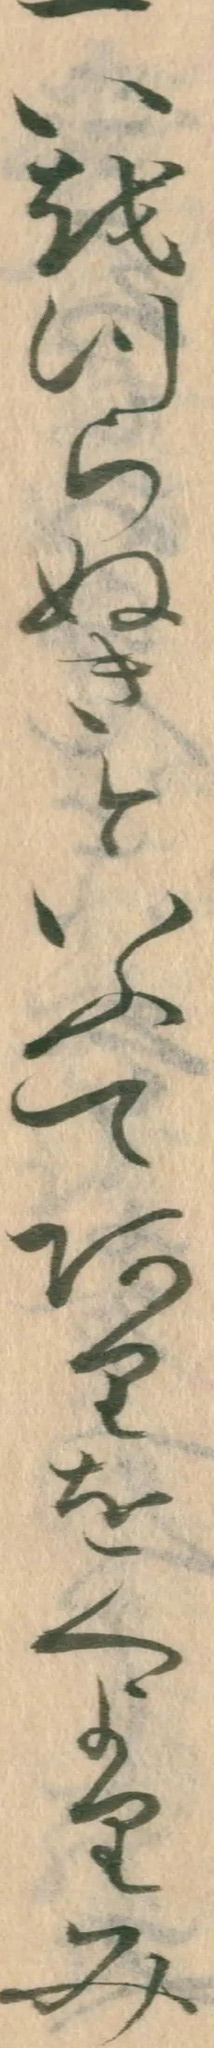一いをつらぬきといふてありをくよりみ
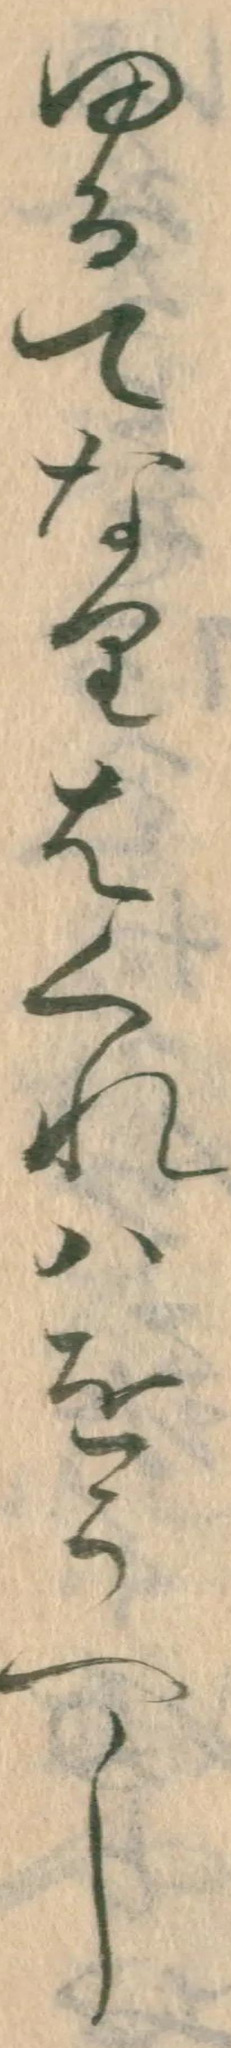ゆるてなりはくれはをうへし
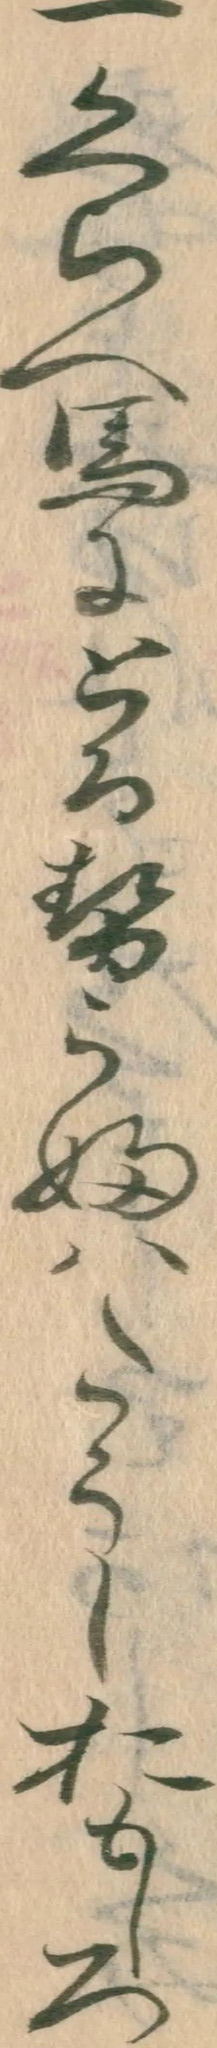一くらへ馬にとるせうふはたうしおもしろ
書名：賀茂社記録. 第13冊
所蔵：国立国会図書館 National Diet Library, JAPAN
